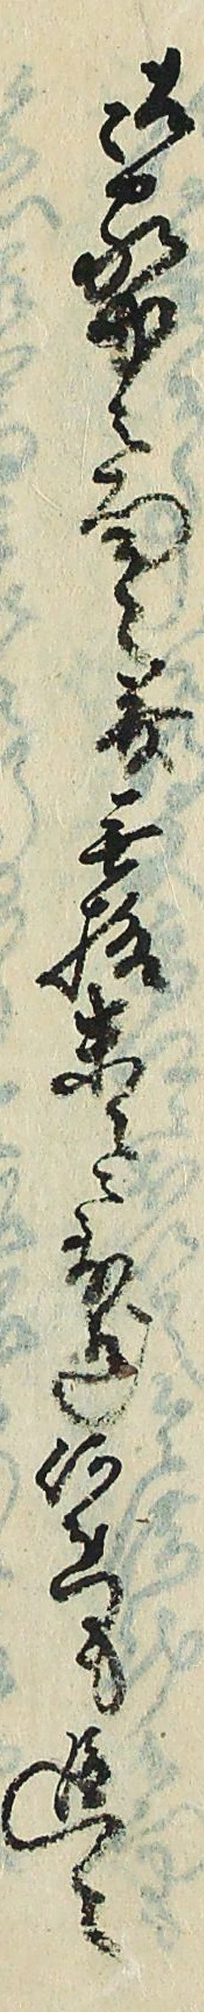御家中之面々幷無格末々ニ至迄何れも追々
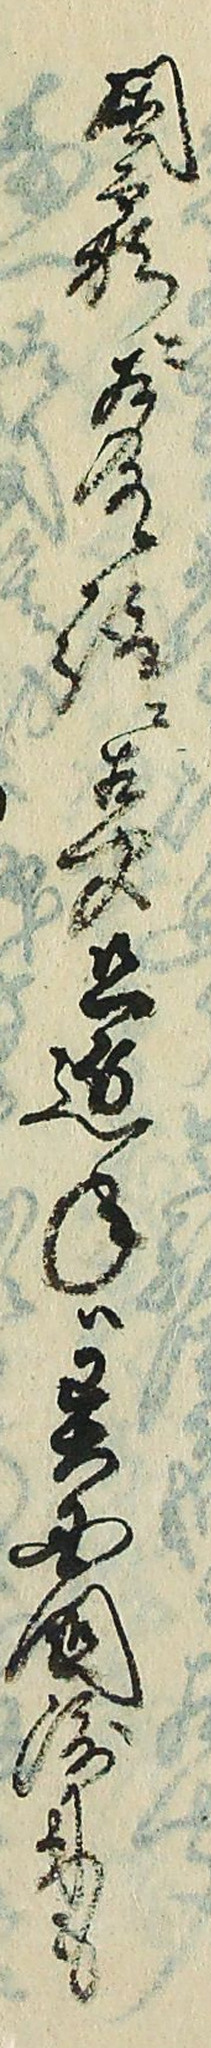困窮ニ相及候趣ニ相聞且近年ハ異国国渡来も
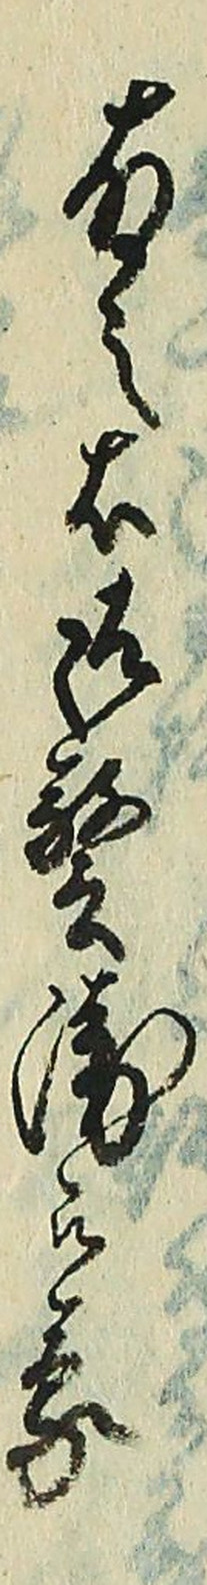有之右御警衛被蒙
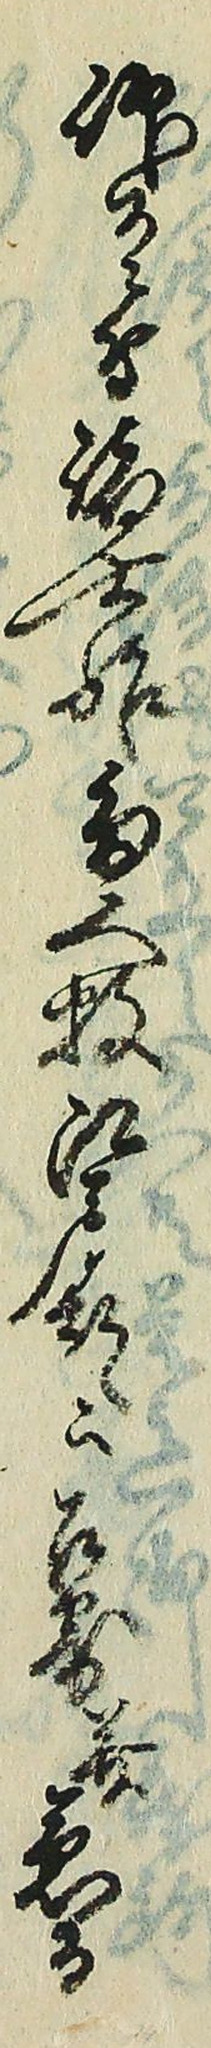仰付ニ付諸士始多人数江戸表へ被召寄幷兼而
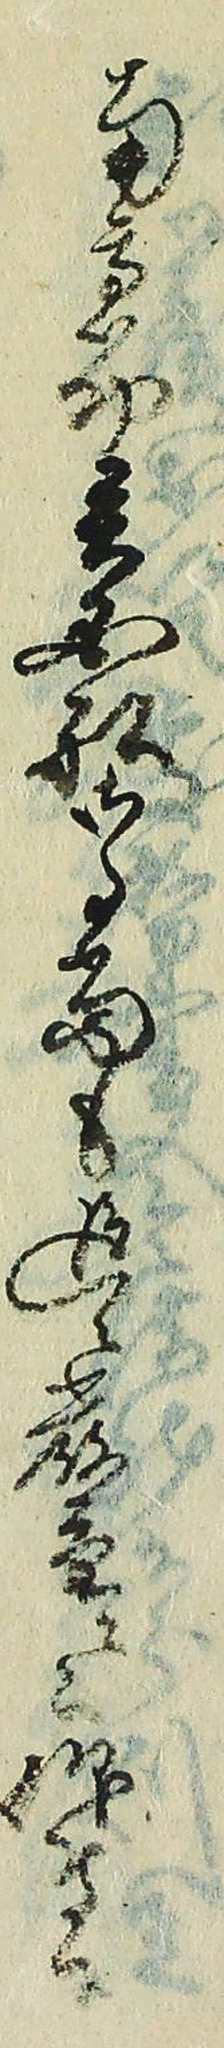南方筋異国船御手當も追々厳重ニ被仰付候
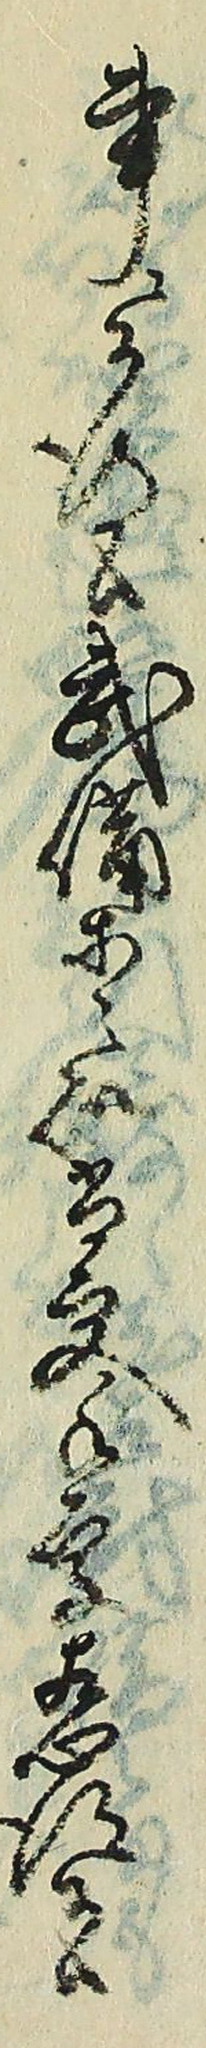事ニ候得ハ武備等之処尚更手厚相心得候ハ
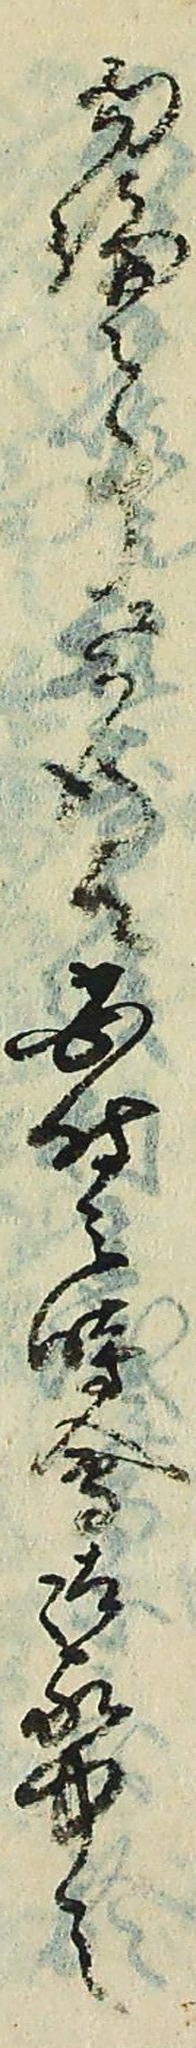勿論之事ニ候得共當時之時會御家中之
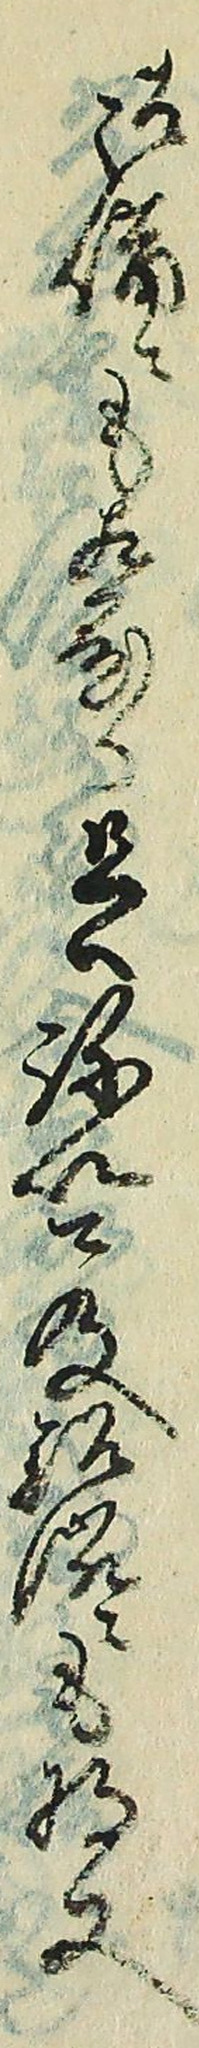御備ニも相懸り且ハ弥以可及難渋ニも将又
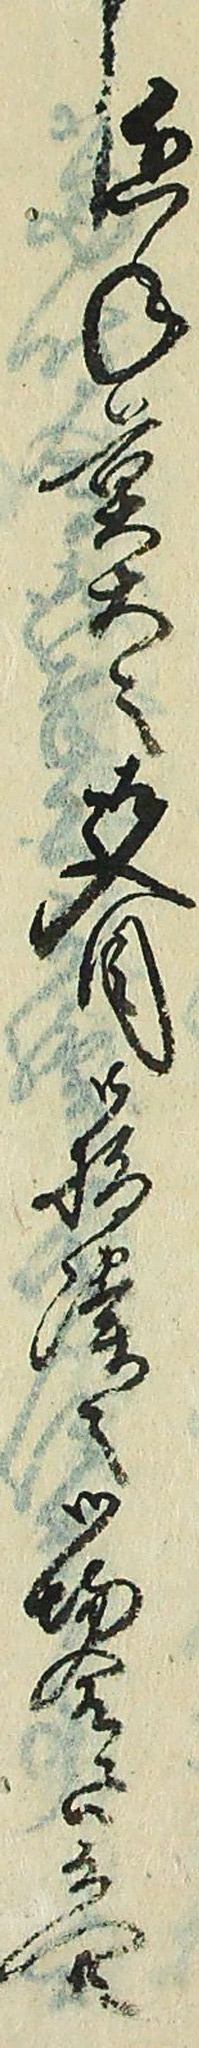近年莫大之御入目被指償之御場合ニハ候へ共
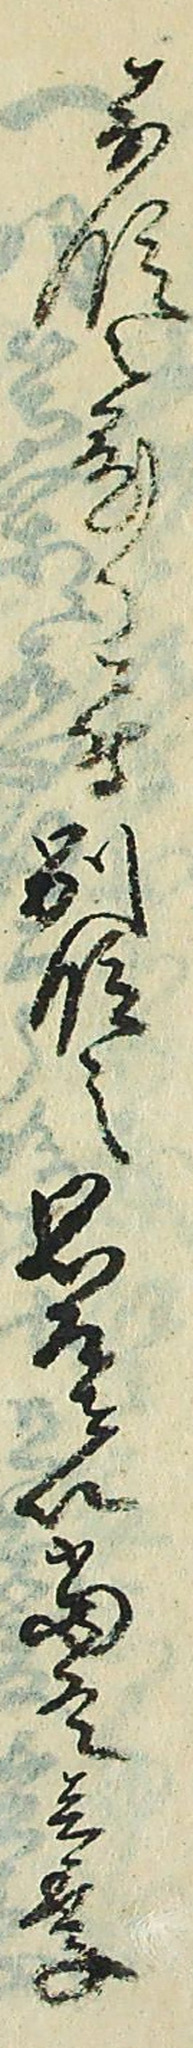別段之懸りニ付別段之思召を以當冬壱季
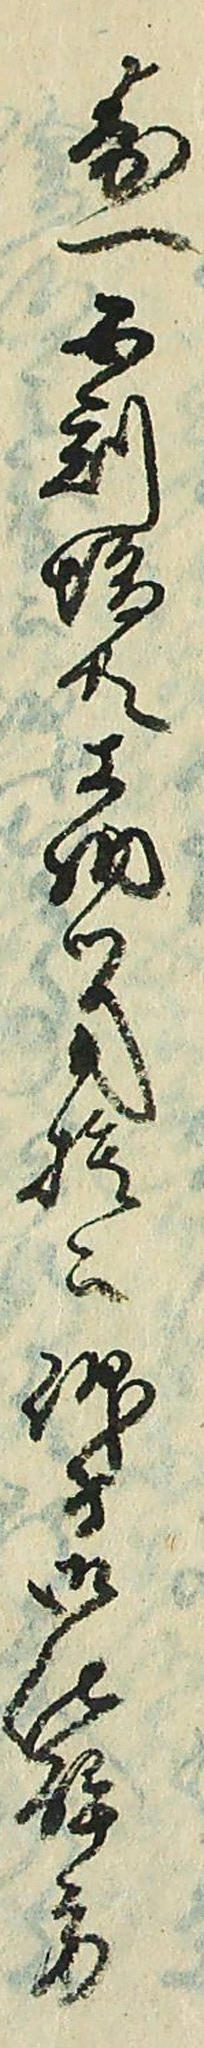歩一五割増共上納御用捨披仰付御仕解方

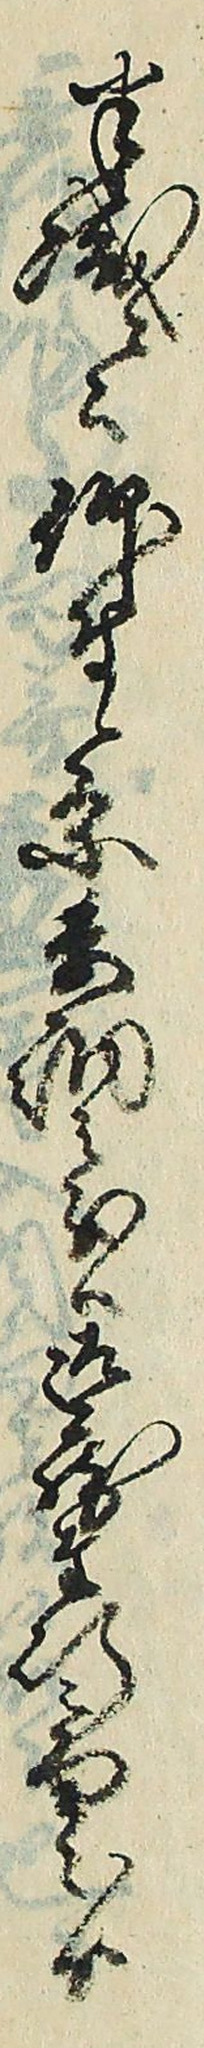半減ニ被仰付候条未納之義ハ御蔵奉行之面々ゟ
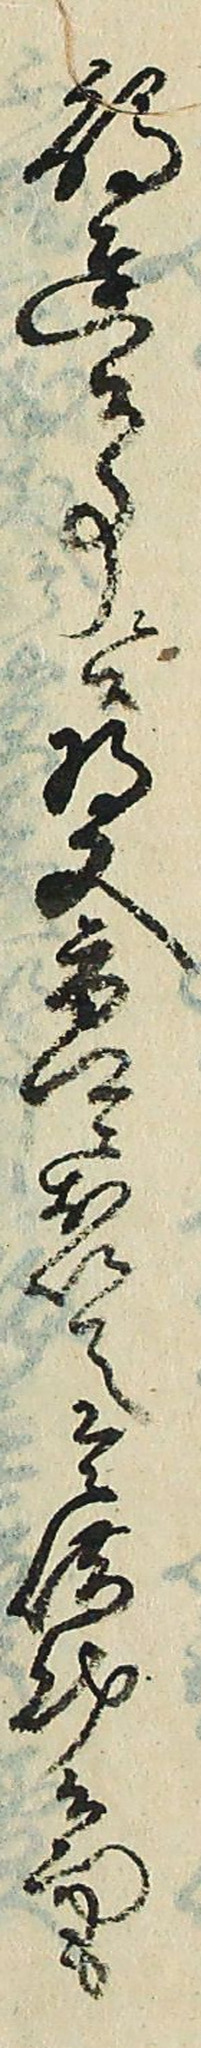觸達候事ニ候将又市郷ニおいて令借財候向も
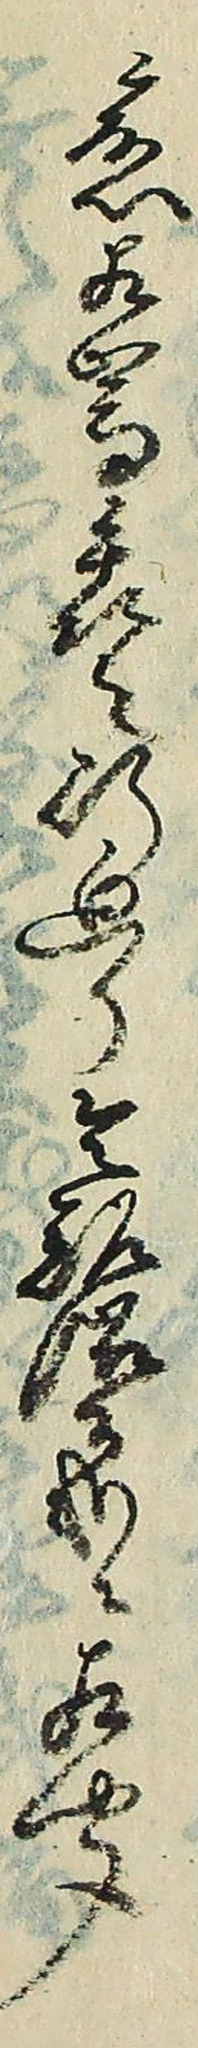愈相嵩犇と行迫り令難渋候哉ニ相聞
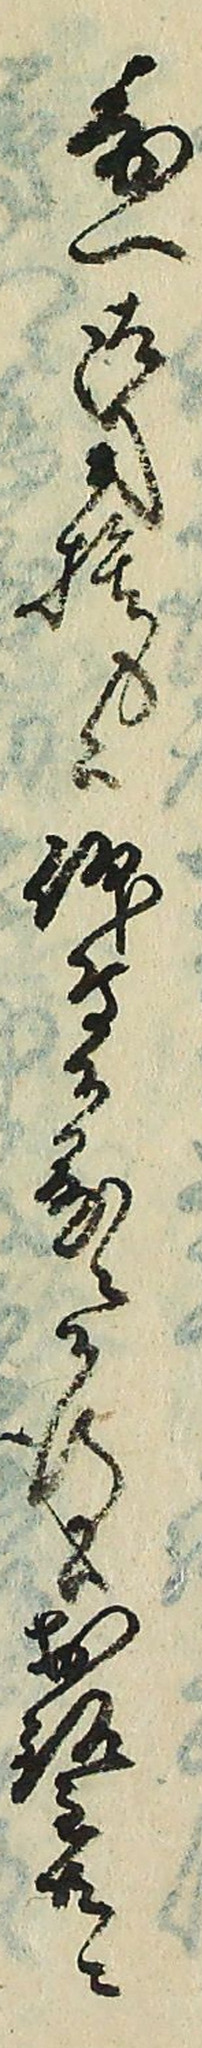歩一御用捨も被仰付候懸ニ候得ハ於銀主共ニ
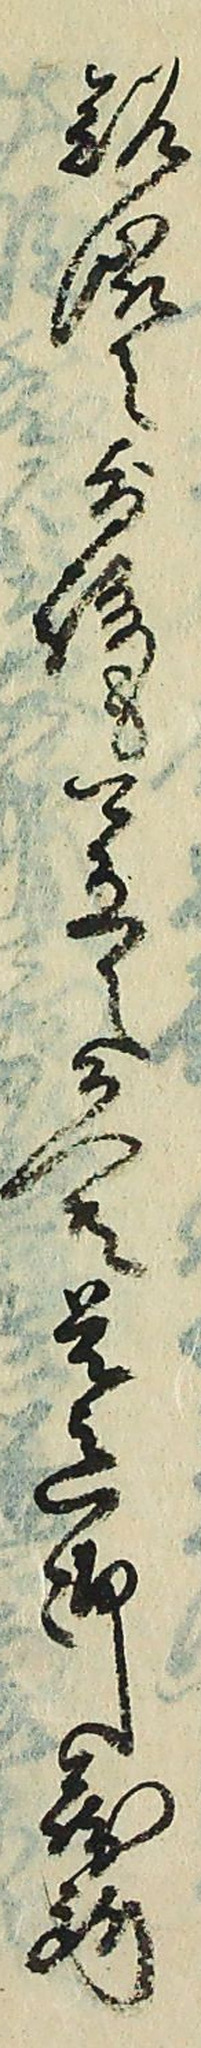難渋之旨趣も可有之候へ者共是迄御蔵所
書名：諸御趣意書并御下知向之写
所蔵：鳴門教育大学 Naruto University of Education
